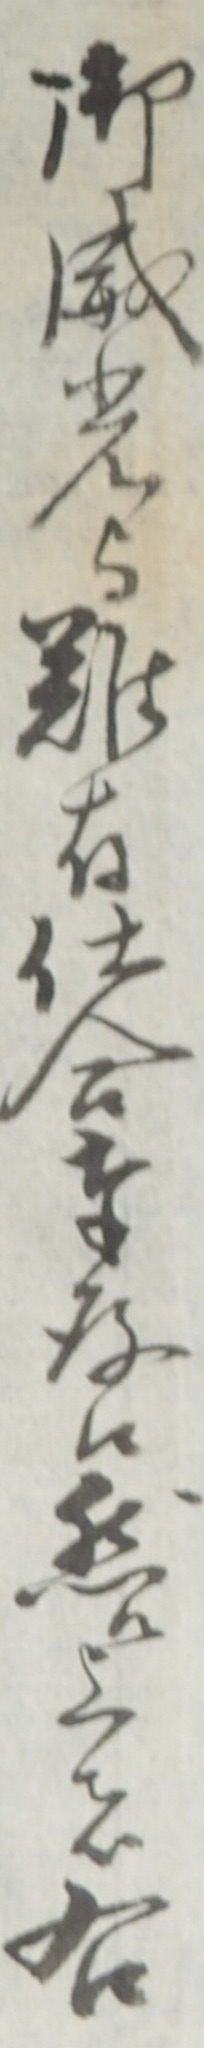御威光与難有仕合奉存候然ル上者右
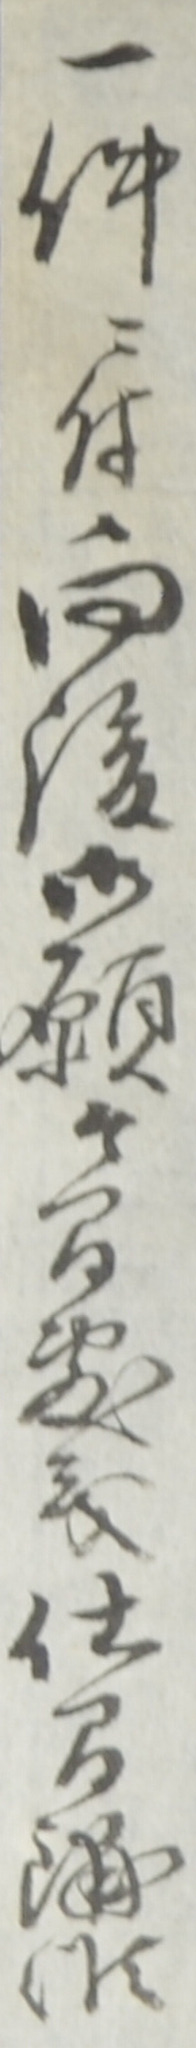一件ニ付向後御願ヶ間敷義仕間鋪候
